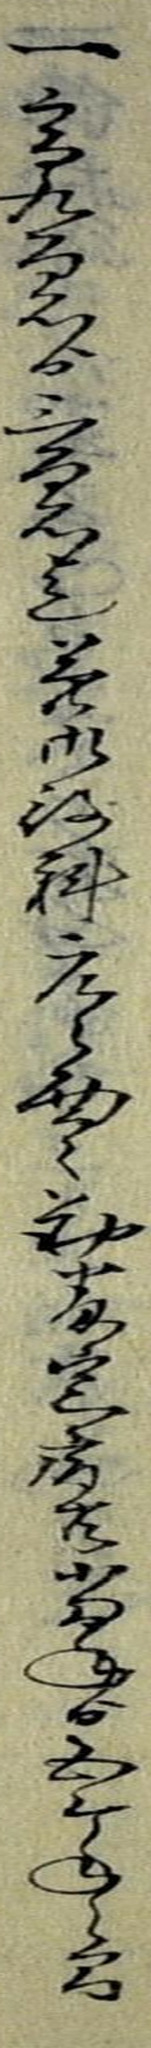一高九百石ゟ三百石迄并御役料取之面々勤番定府共当年ゟ五ヶ年之間
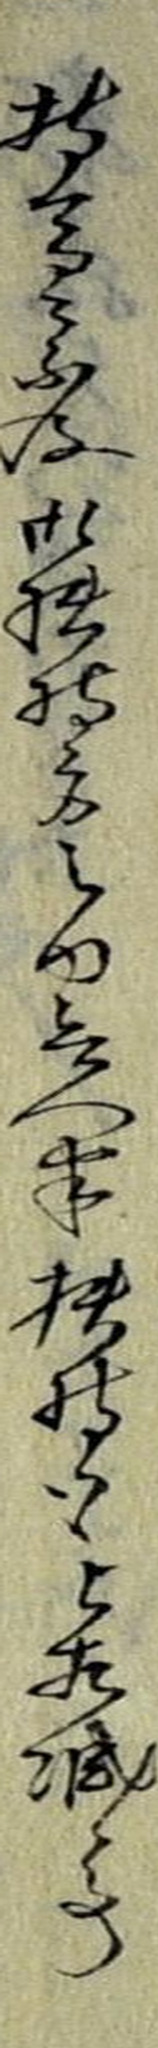持馬に不及御扶持方之内壱人半扶持つヽ被相減候事
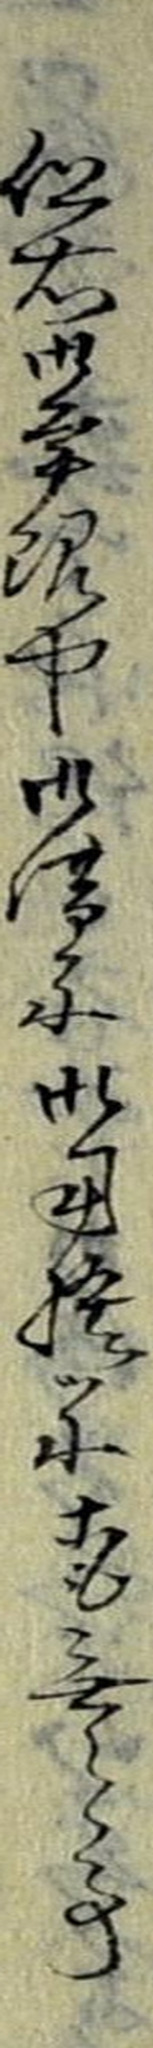但右御年限中御借米御用捨米等も無之候事
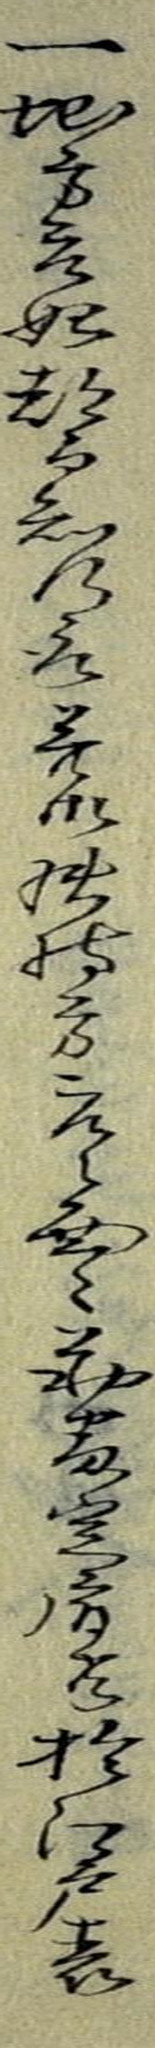一地方取始都而知行取并御扶持方取之面々勤番定府共於江戸表
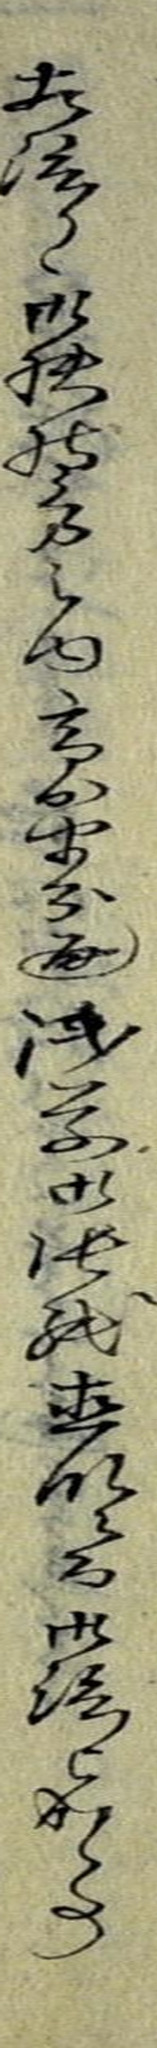相渡り候御扶持方之内高ゟ半分通浅草御張紙直段に而御渡に被成候事
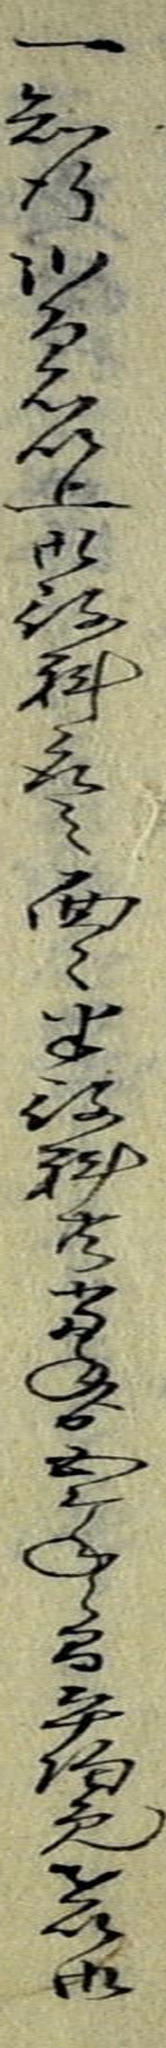一知行弐百石以上御役料取之面々半役料共当年ゟ五ヶ年之間平均免を以御
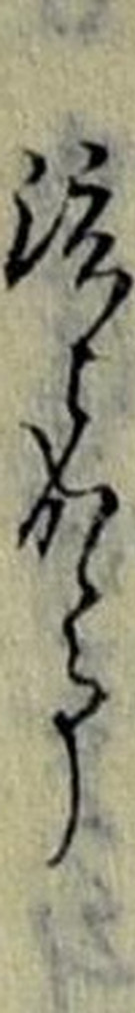渡被成候事
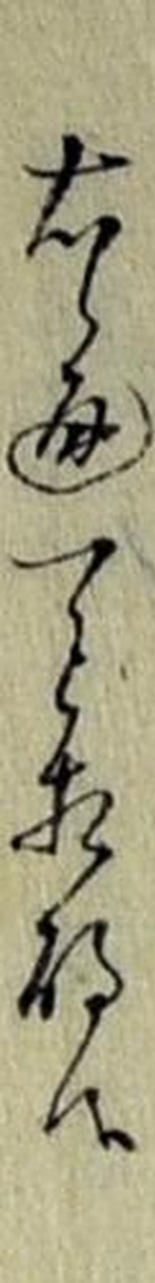右之通可被相触候
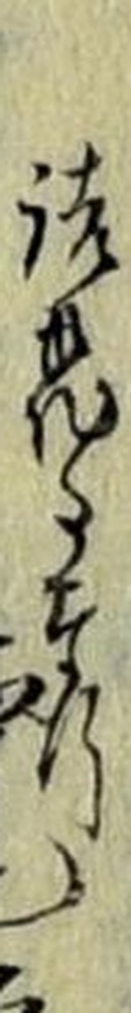詰御作事奉行
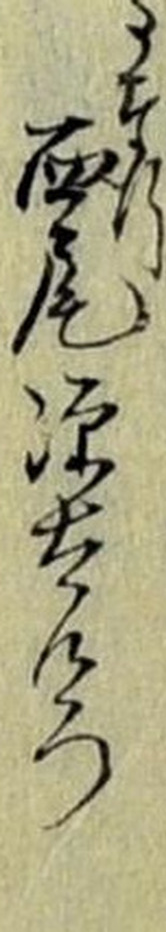西尾源太左衛門
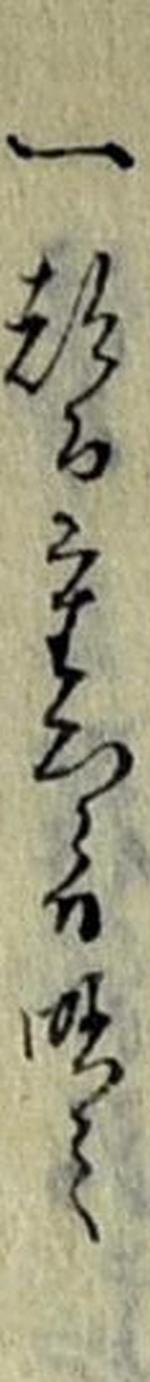一都而重出に付略之
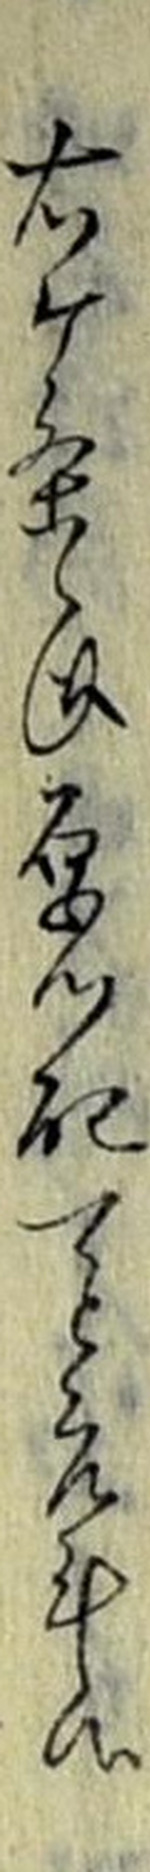右ヶ条之趣厚心配可被取斗候
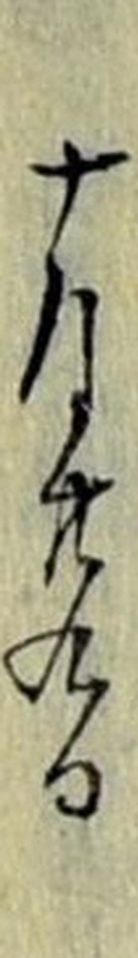十月廿九日

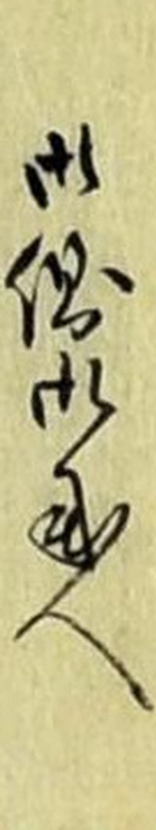御側御用人
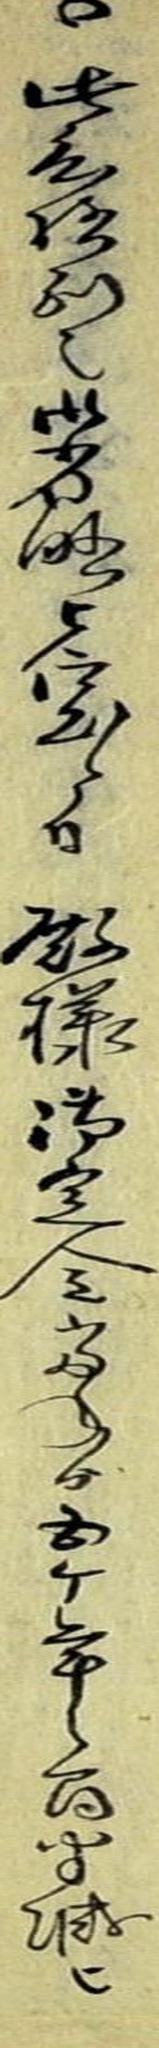○此度各別之御省略被仰出候に付殿様御定金当年ゟ五ヶ年之間半減被
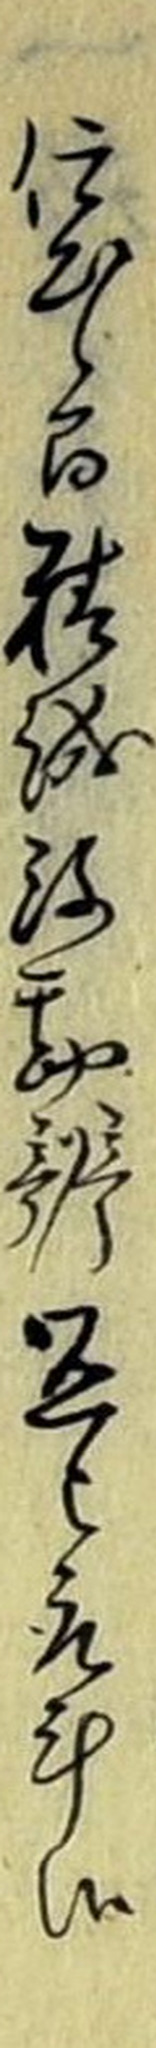仰出候間精誠致勘弁宜被取斗候
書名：命令之部 六
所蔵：福井県文書館 Fukui Prefectural Archives
